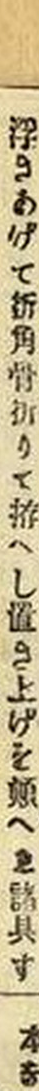浮きあげて折角骨折りて拵へし置き上げを顛へし諸具す
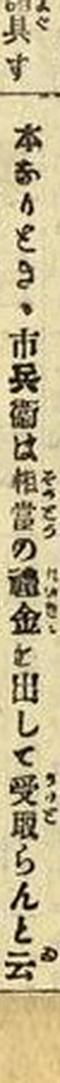本なりときゝ市兵衛は相當の禮金を出して受取らんと云
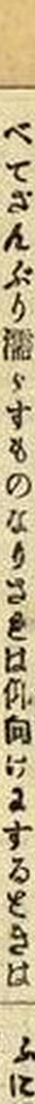べてざんぶり濡らすものなりされは仰向けにするときは
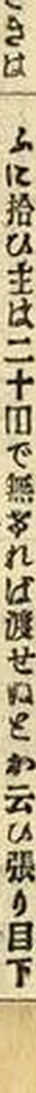ふに拾ひ主は二十圓で無ければ渡せぬとか云ひ張り目下
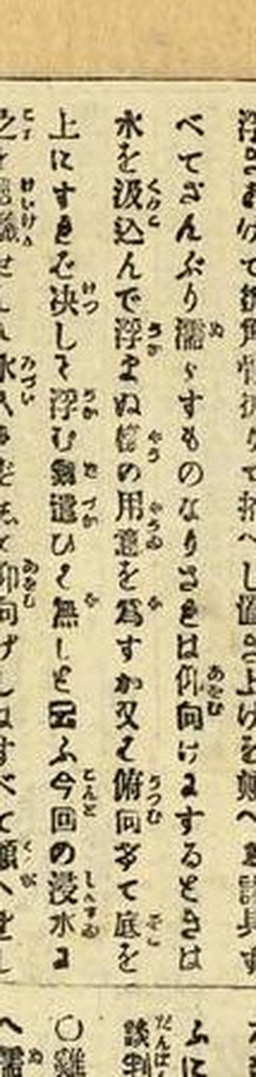水を汲込んで浮まぬ樣の用意を爲すか又は俯向けて底を
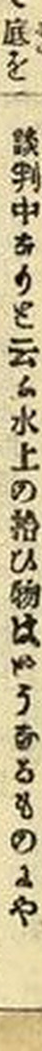談判中なりと云ふ水上の拾ひ物はどうなるものにや
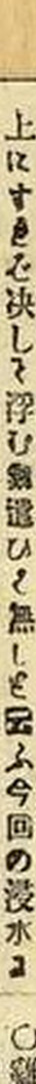上にすれば決して浮む氣遣ひは無しと云ふ今回の浸水に
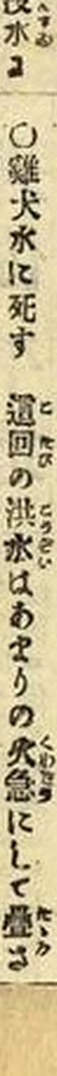○鶏犬水に死す這回の洪水はあまりの火急にして疂さ
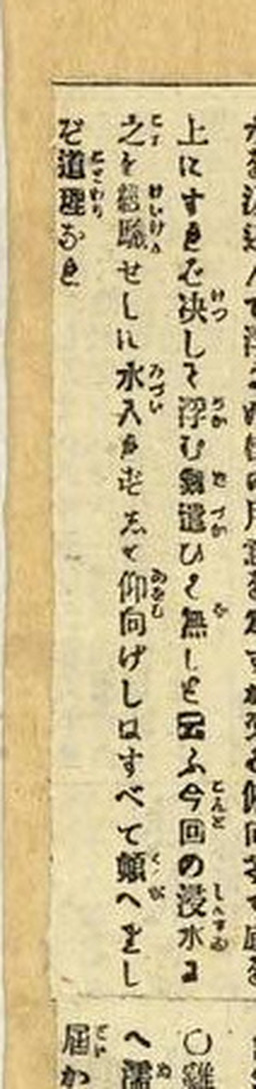之を経験せしに水入れずして仰向けしはすべて顛へせし
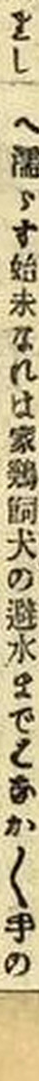へ濡らす始末なれは家鶏飼犬の避水まではなか〳〵手の
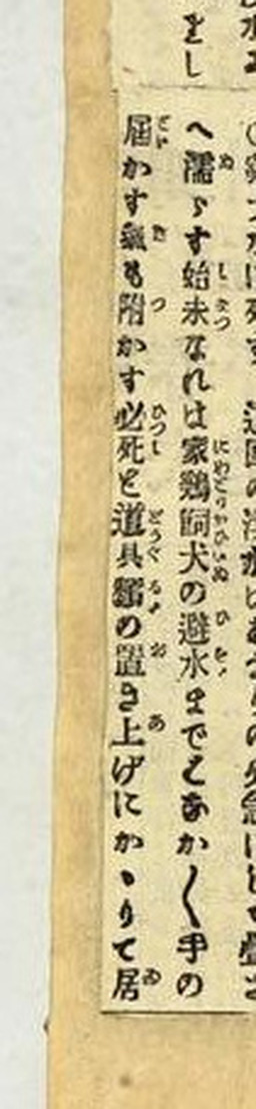届かす氣も附かす必死と道具類の置き上げにかゝりて居

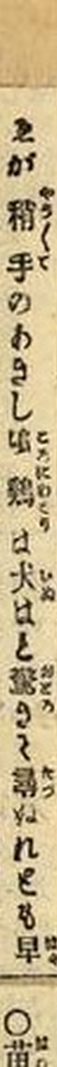しが稍手のあきし頃鶏は犬はと驚きて尋ぬれども早
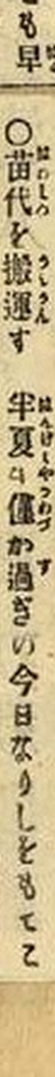○苗代を搬運す半夏生僅か過ぎの今日なりしをもてこ
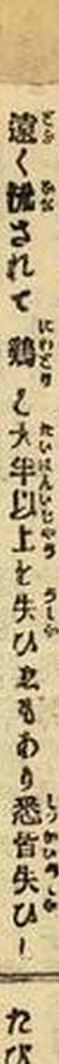遠く流されて鶏は大半以上失ひしもあり悉皆失ひし
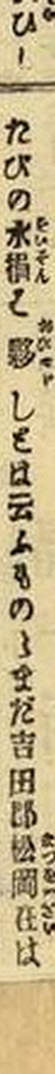たびの水損は夥しとは云ふものゝまだ吉田郡松岡在は
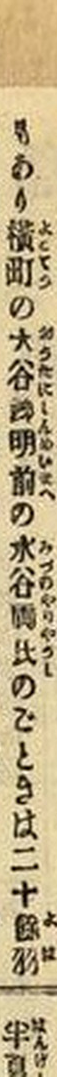もあり横町の大谷神明前の水谷兩氏のごときは二十餘羽
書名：温古集 五巻
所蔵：福井県文書館 Fukui Prefectural Archives
